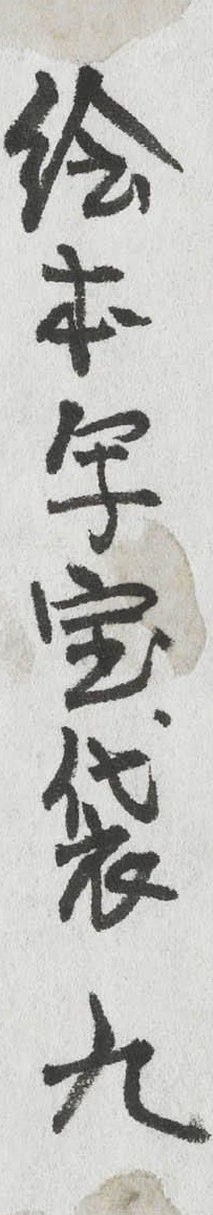絵本写宝袋九
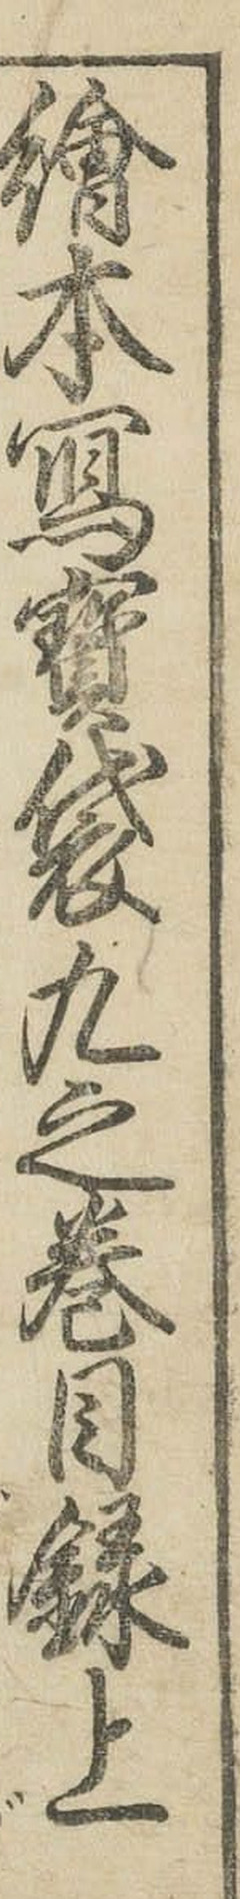絵本写宝袋九之巻目録上
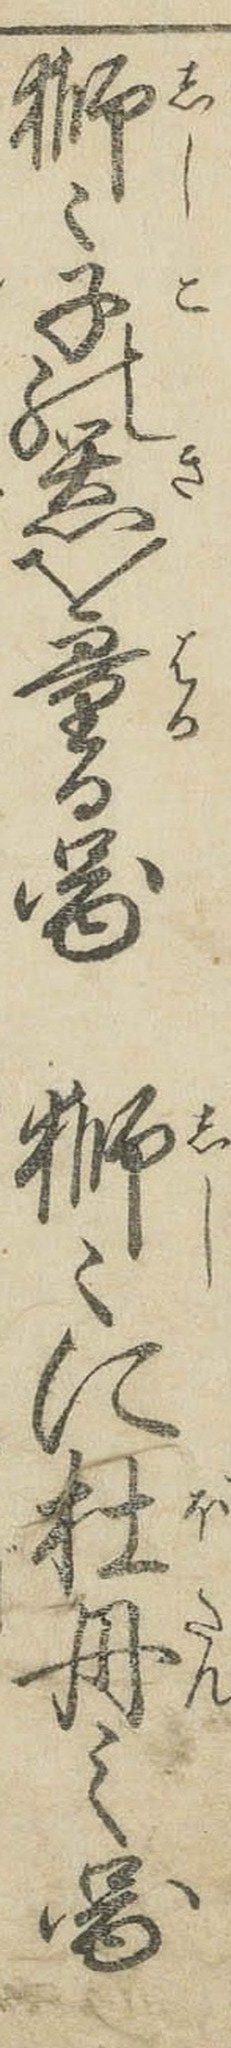獅々子の器を量る図獅々に牡丹之図

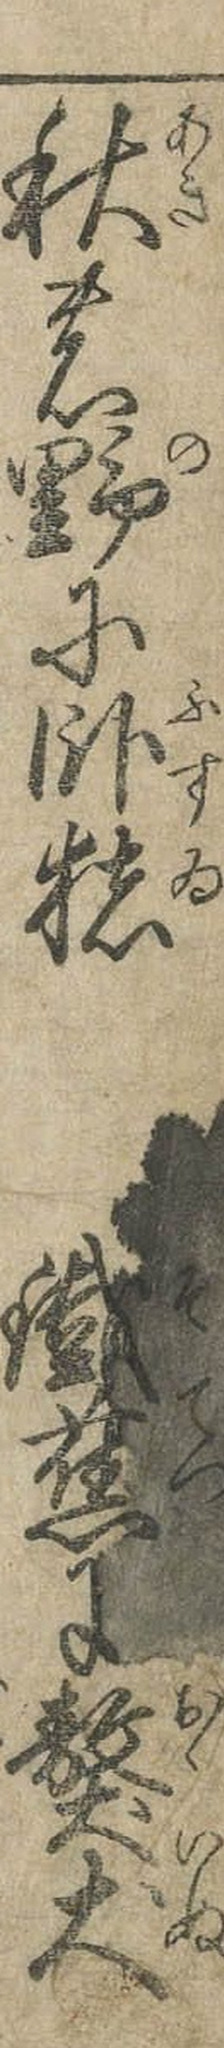秋の野に臥猪鉄蕉に獒犬
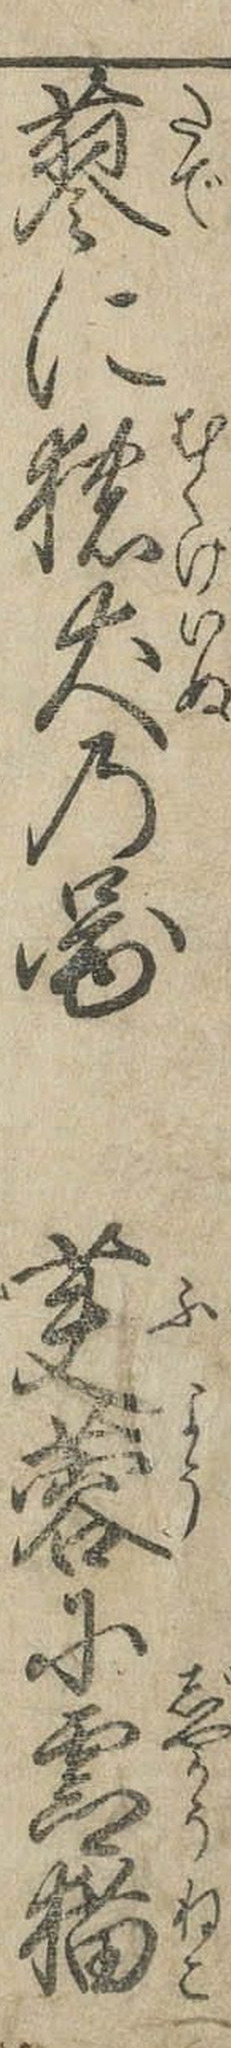蓼に㺜犬の図芙蓉に霊猫
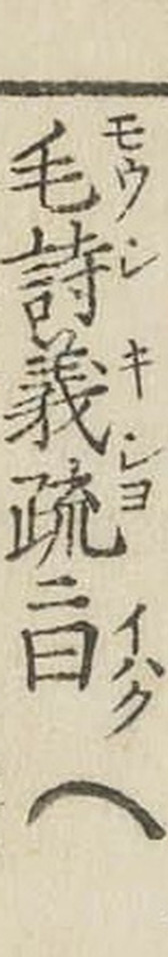毛詩義疏ニ曰
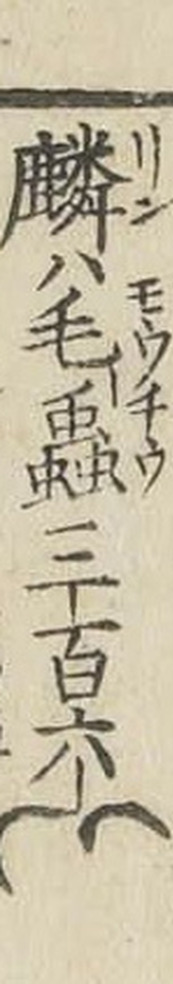麟ハ毛-虫三-百-六-

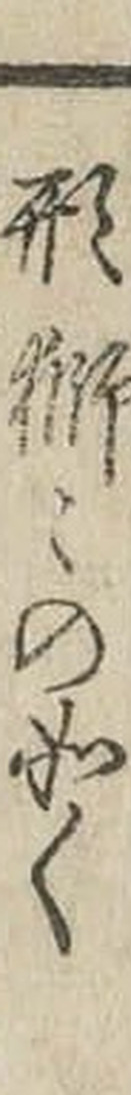形獅々の如く
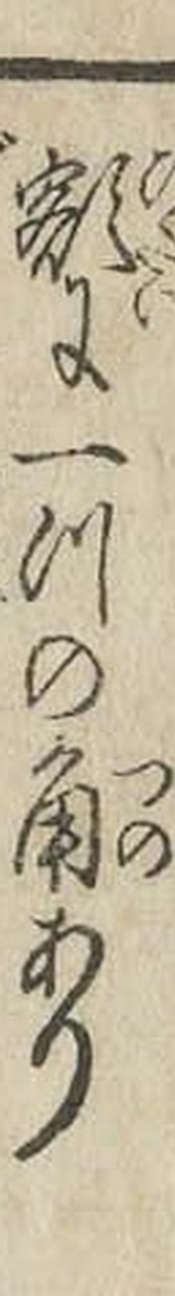額に一つの角あり
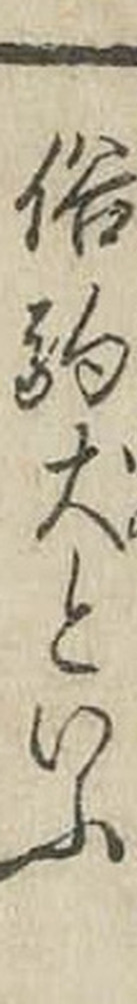俗駒犬といふ
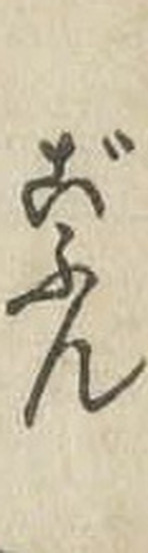ごふん
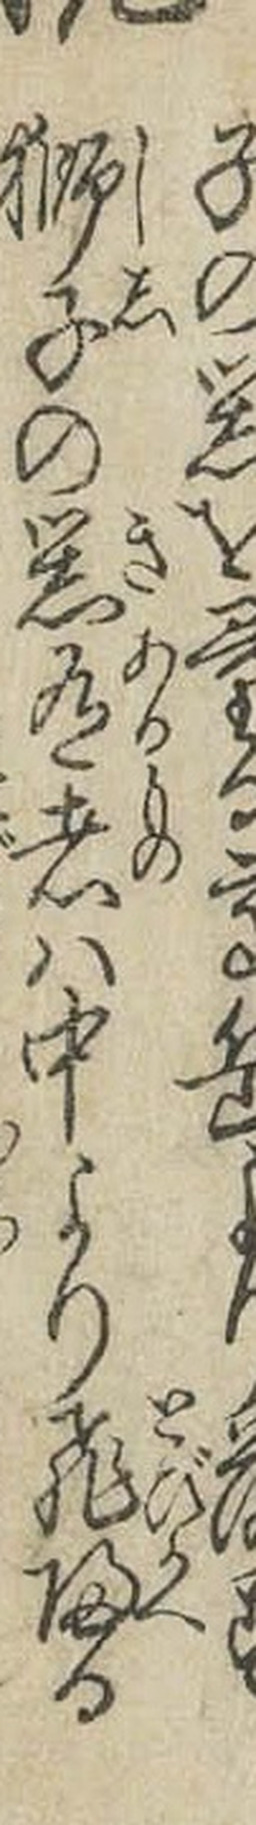狻猊獅子の器有者は中より飛帰る
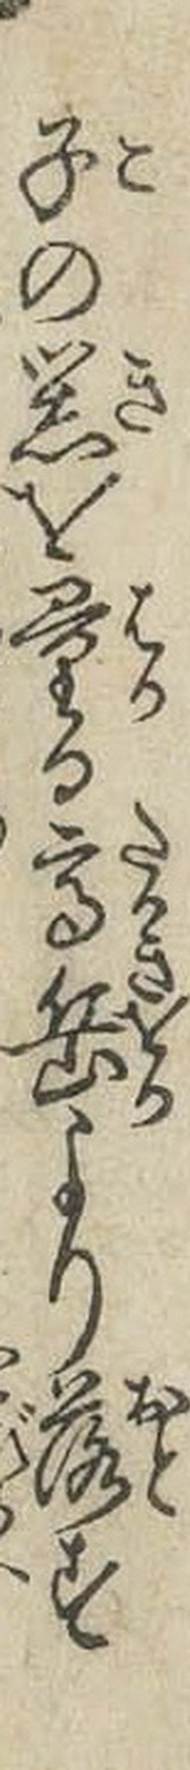子の器を量る高岳より落す
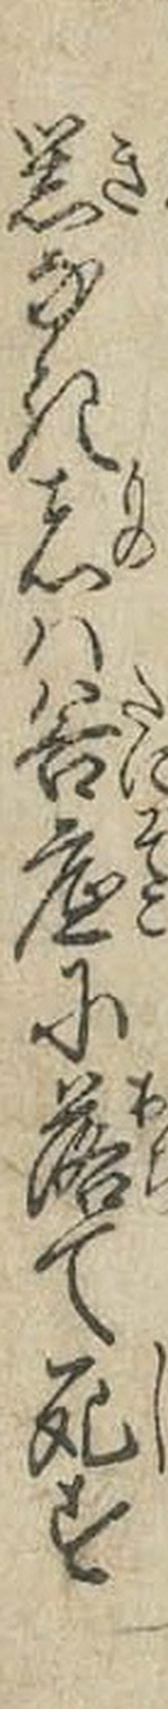器なき者は谷底に落て死す

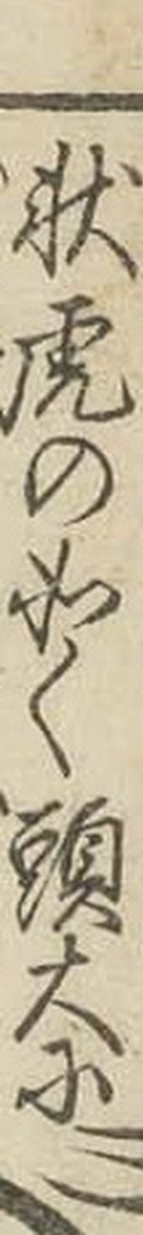状虎の如く頭大に
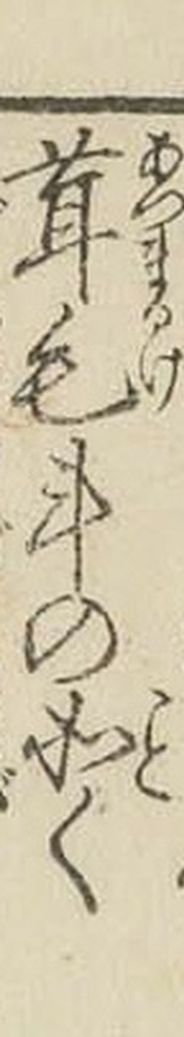茸毛計の如く
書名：絵本写宝袋 9巻 9之巻上
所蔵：東京学芸大学教育コンテンツアーカイブ
